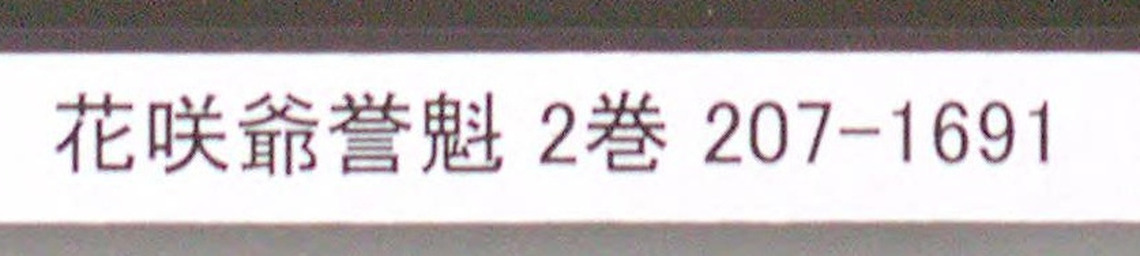花咲爺誉魁
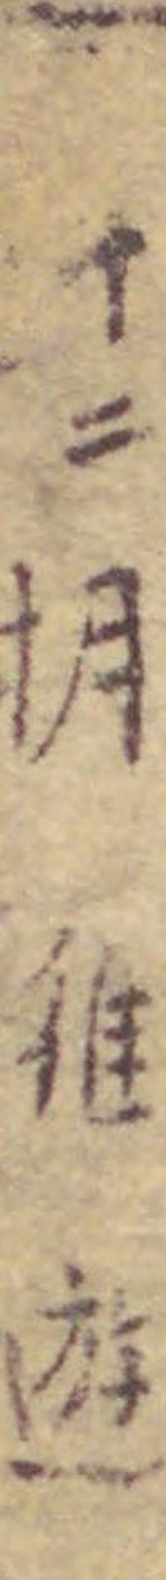十二月稚遊
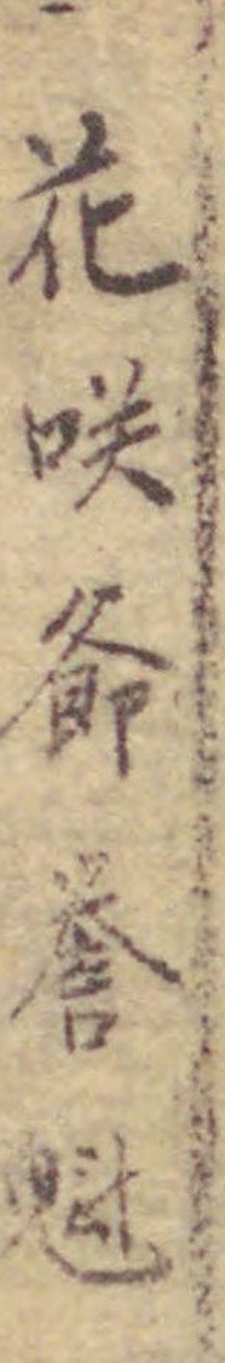花咲爺誉魁
